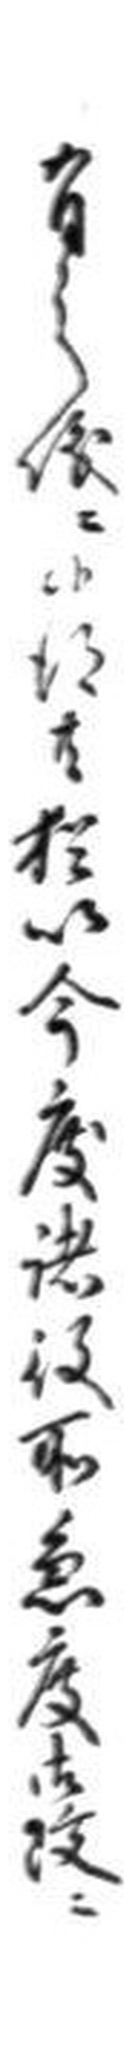有之儀ニ候得共猶以今度諸役所急度御改ニ
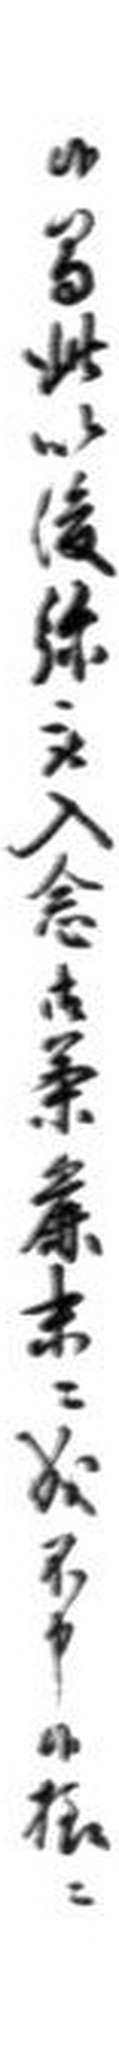候間此以後弥被入念御茶麁末ニ成不申候様ニ
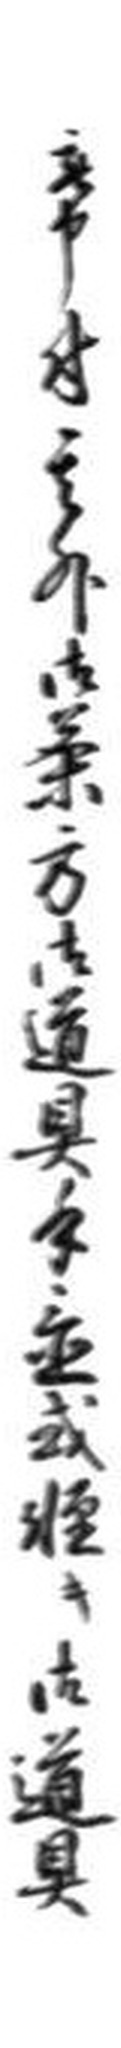被申付其外御茶方御道具手置或軽キ御道具
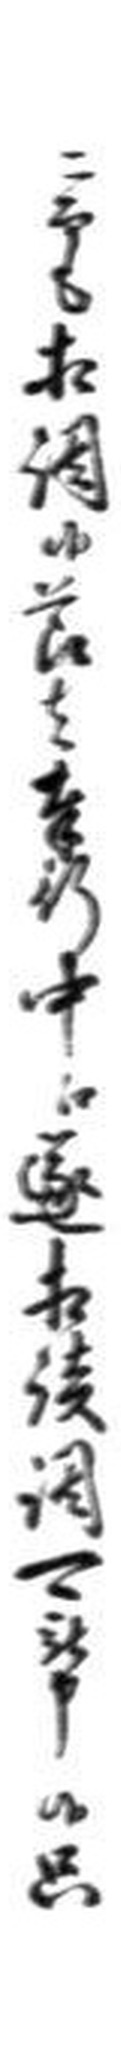ニ而も相調候節者奉行中江遂相談調可被申候只
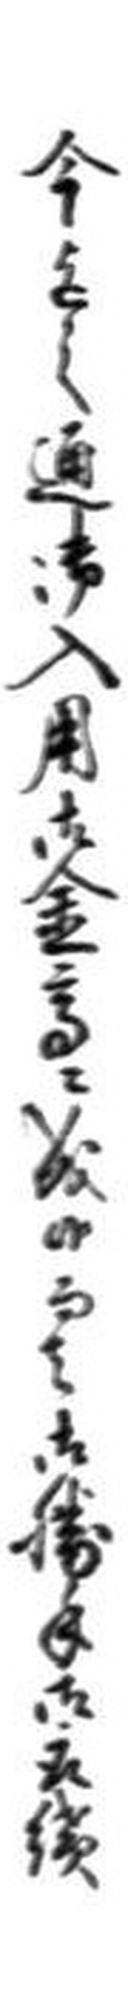今迄之通御入用御金高ニ成候而者御勝手御取続
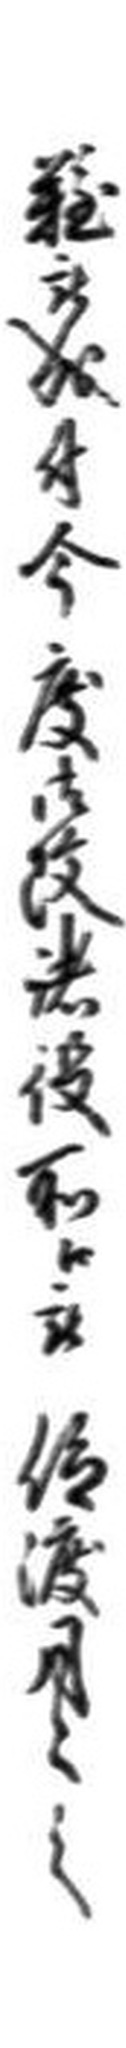難被成付今度御改諸役所江被仰渡月々之
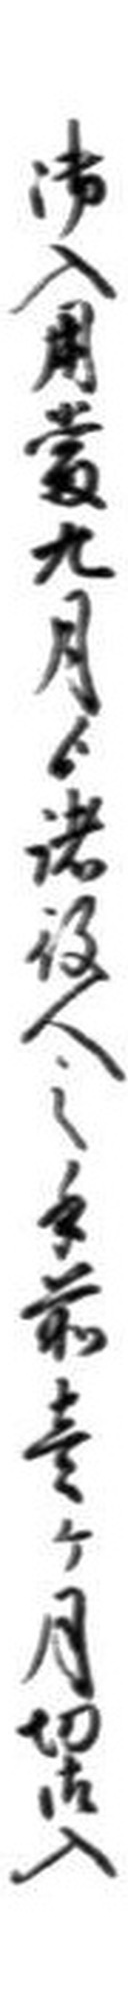御入用当九月ゟ諸役人之手前壱ヶ月切御入
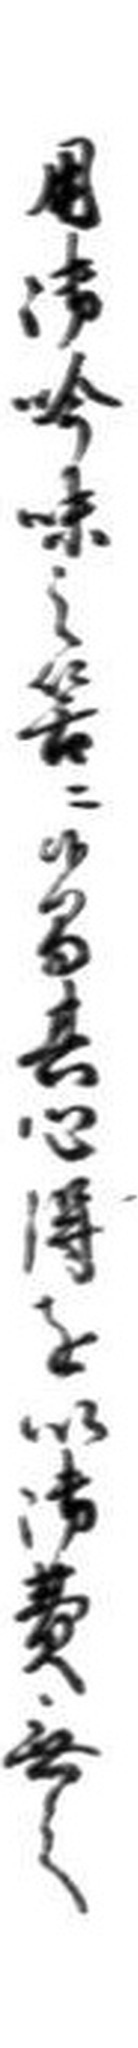用御吟味之筈ニ候間其心得を以御費無之
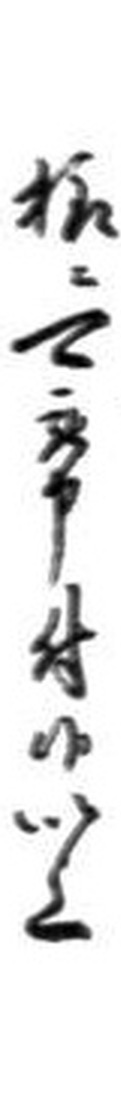様ニ可被申付候以上
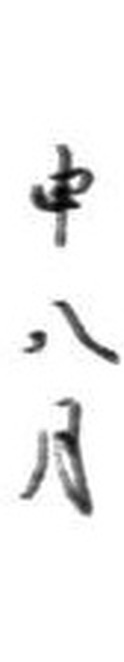申八月

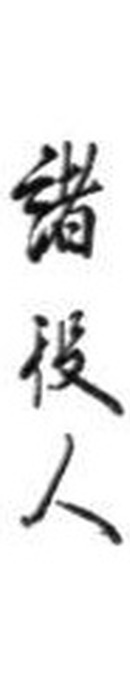諸役人
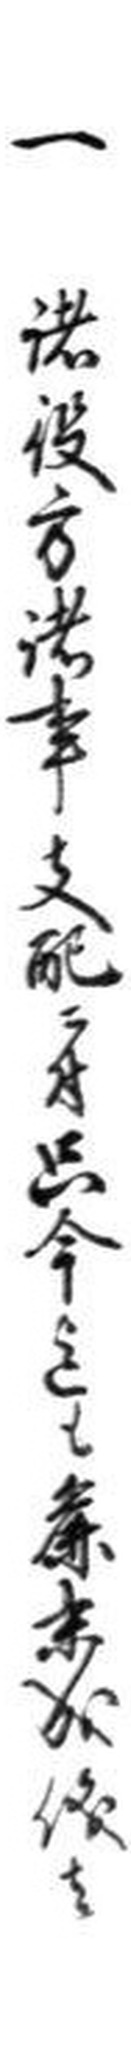一諸役方諸事支配ニ付只今迄も麁末成儀者
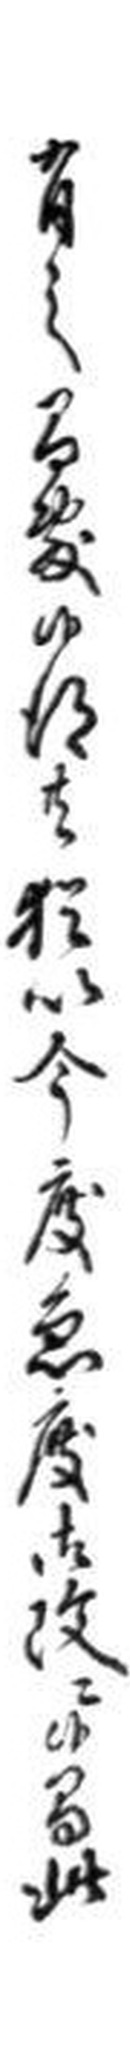有之間敷候得共猶以今度急度御改ニ候間此
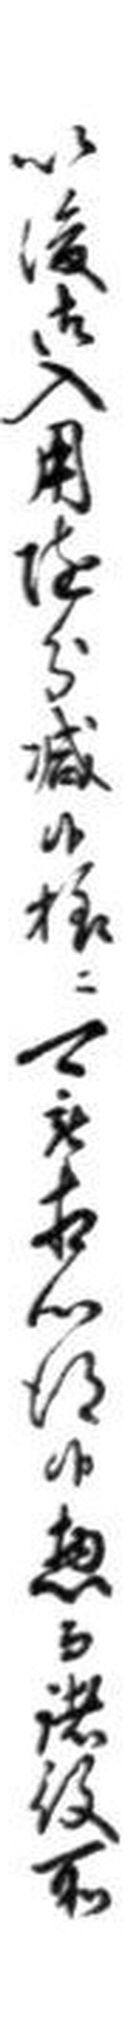以後御入用随分減候様ニ可被相心得候惣而諸役所
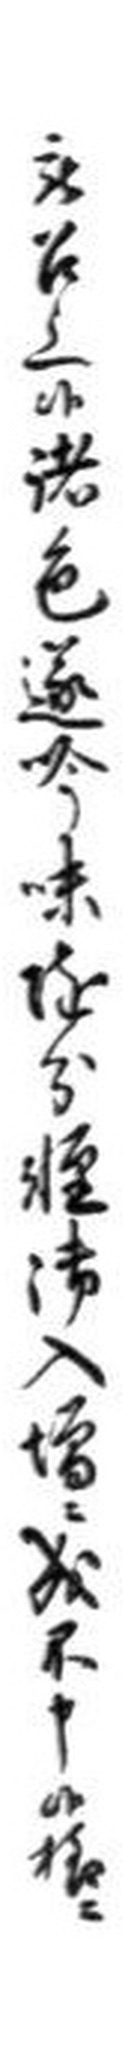被召上候諸色遂吟味随分御入増ニ成不申候様ニ
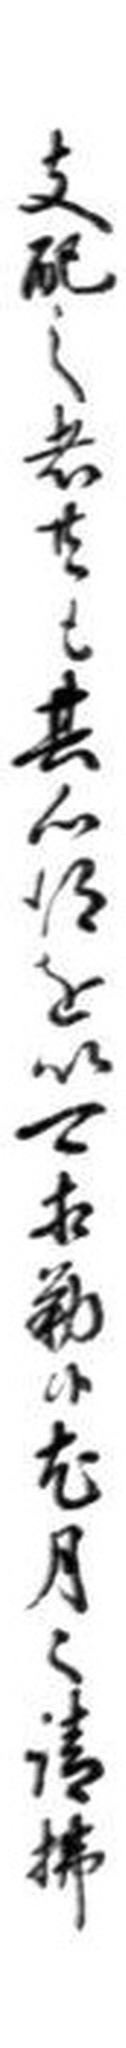支配之者共も其心得を以可相勤候尤月々請払
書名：家譜 三十一 吉邦公 享保元年
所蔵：福井県文書館 Fukui Prefectural Archives
